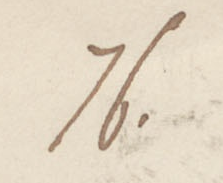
76.
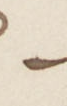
bilder
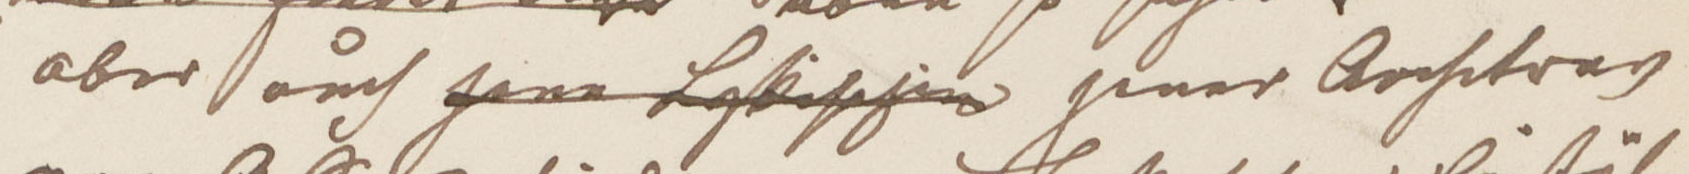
aber auch jene Lykischen jener Architrav
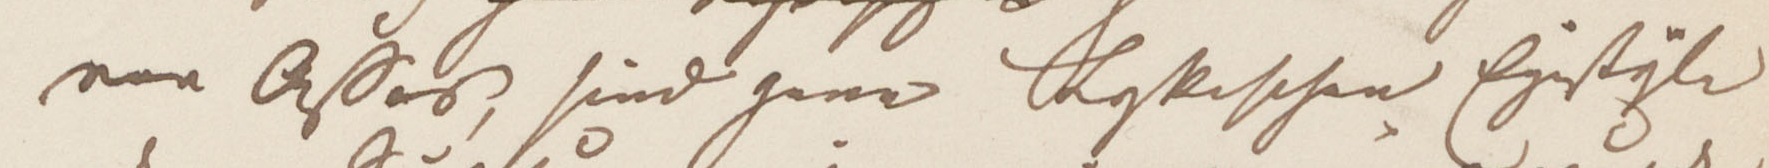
von Assos, sind jene Lykischen Epistyle
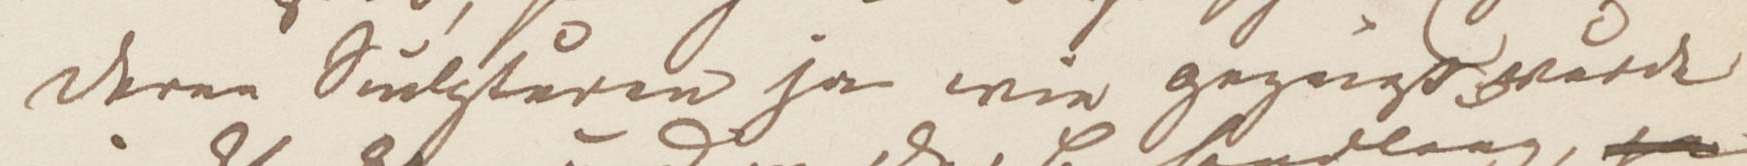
deren Sculpturen ja wie gezeigt wurde
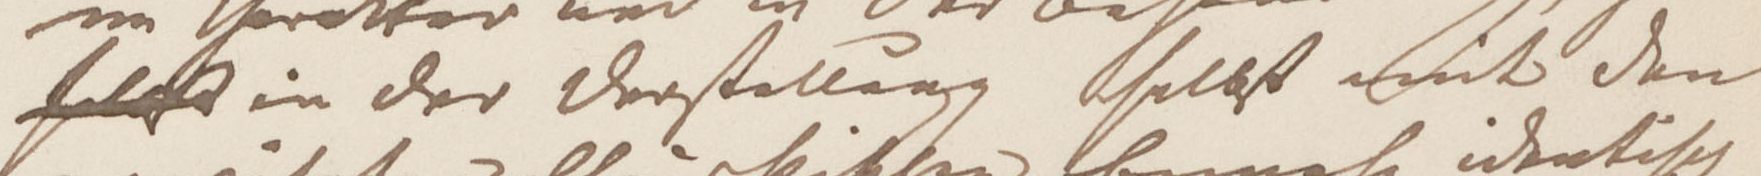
selbst in der Darstellung selbst mit den
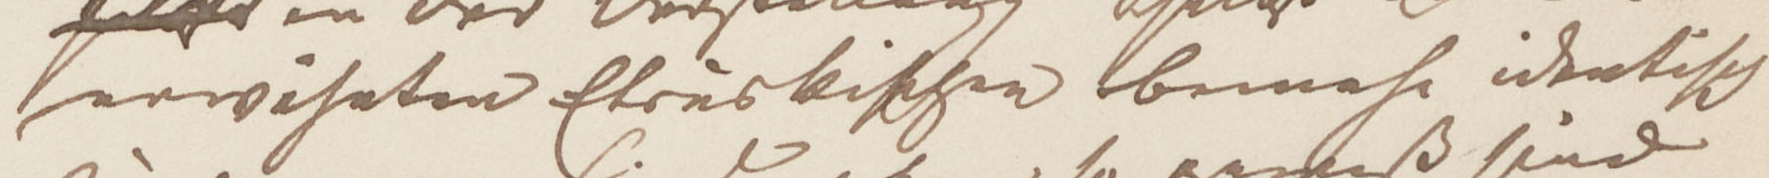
erwähnten Etruskischen beinahe identisch
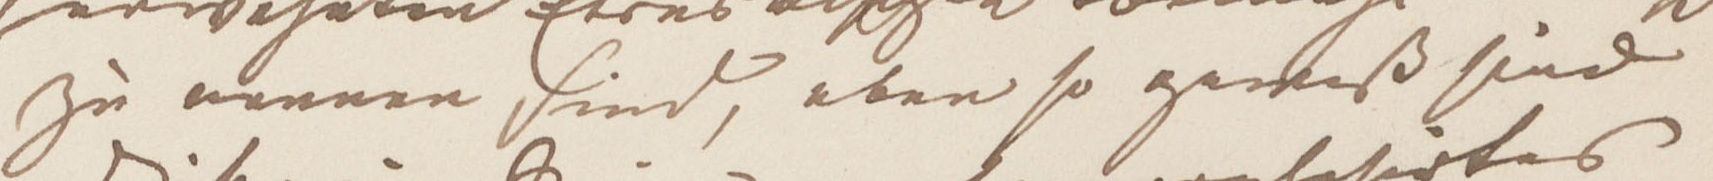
zu nennen sind, eben so gewiss sind
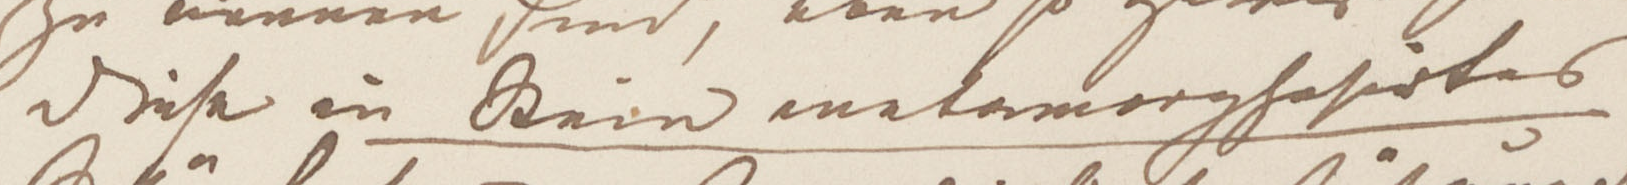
diese in Stein metamorphosirtes
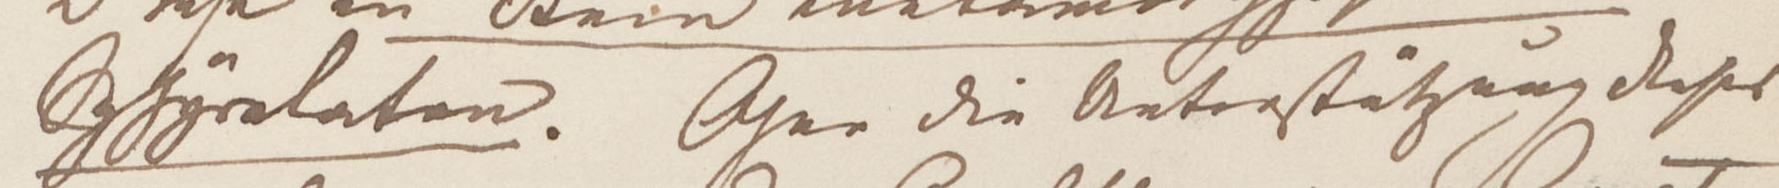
Sphyrelaten. Ohne die Unterstützung dieses
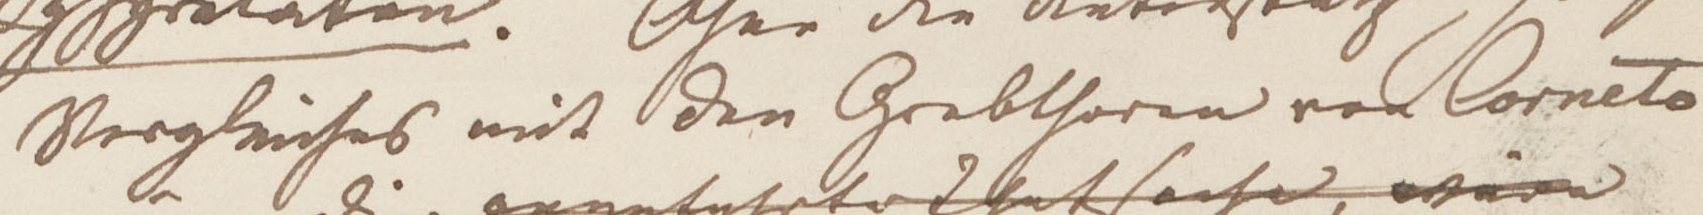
Vergleiches mit den Grabthoren von Corneto
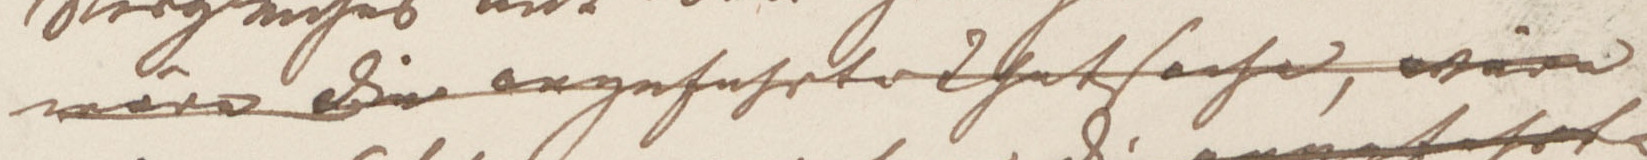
wäre die angefuhrte Thatsache, wäre
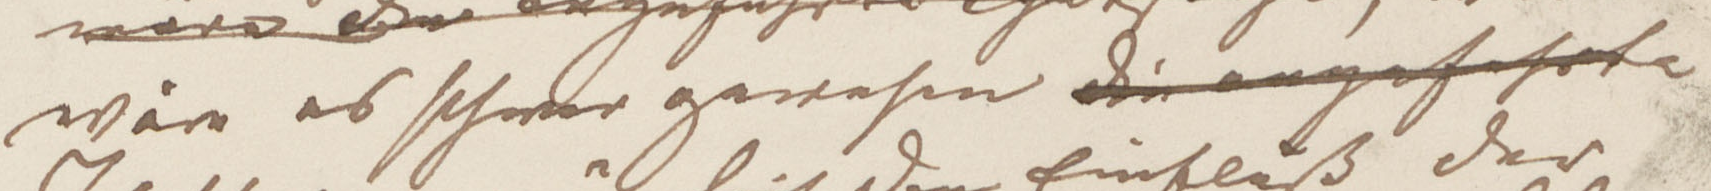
wäre es schwer gewesen die angefuhrte
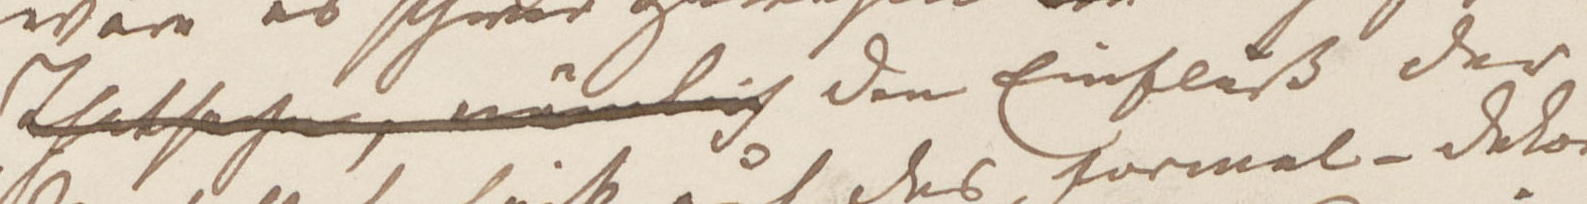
Thatsache, nämlich den Einfluss der
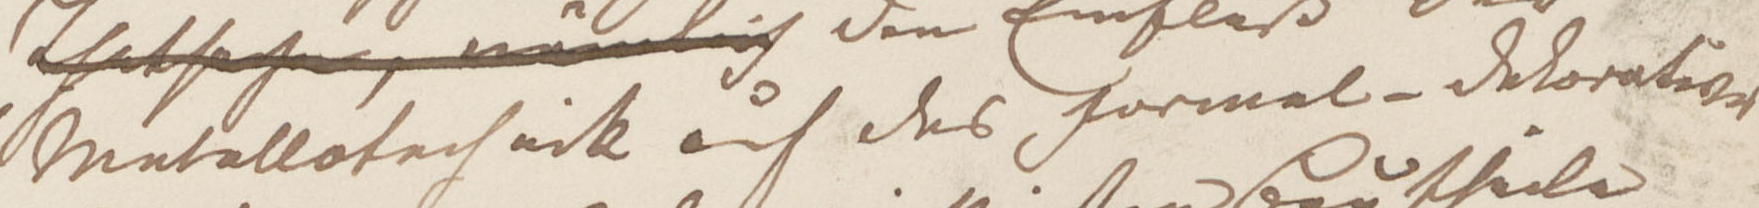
Metallotechnik auf das Formal-dekorative
